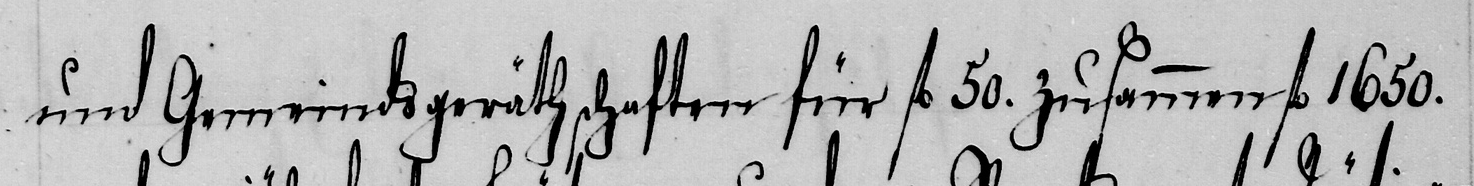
und Gemeindsgeräthschaften für fl. 50. zusammen fl. 1650.
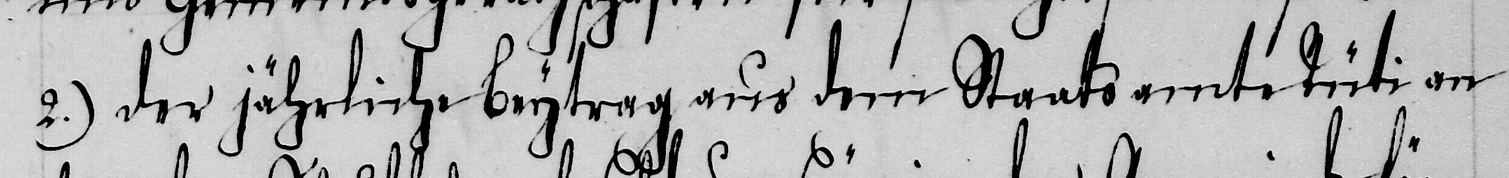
2.) der jährliche Beytrag aus dem Staatsamte Rüti an
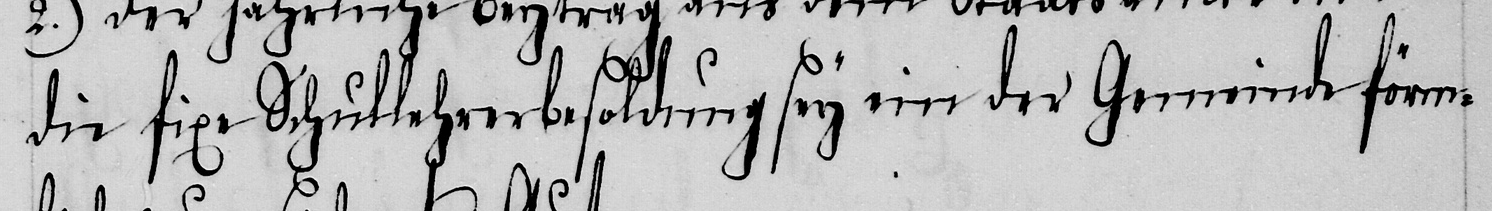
die fixe Schullehrerbesoldung sey ein der Gemeinde förm¬
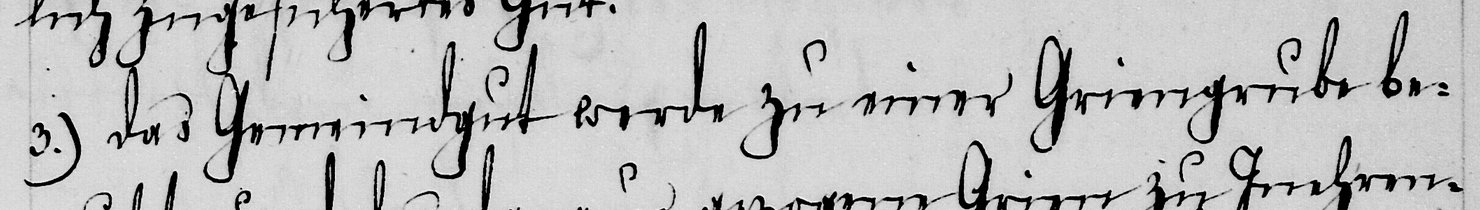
3.) das Gemeindgut werde zu einer Griengrube be¬
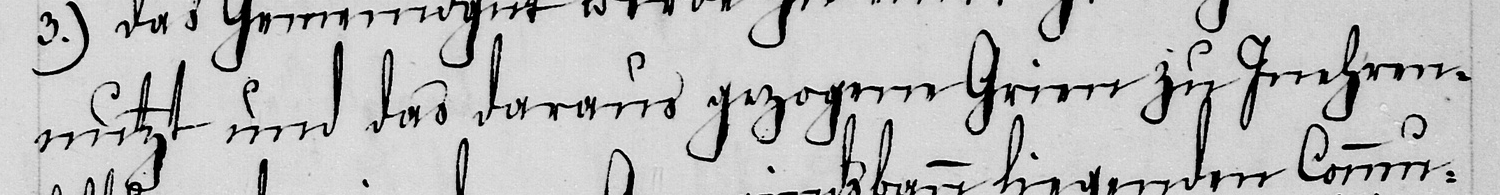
nutzt und das daraus gezogene Grien zu Inehren¬
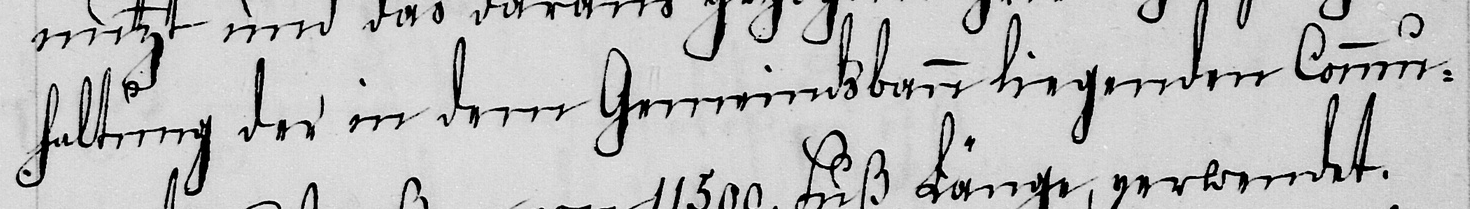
haltung der in dem Gemeindsbann liegenden Commu¬
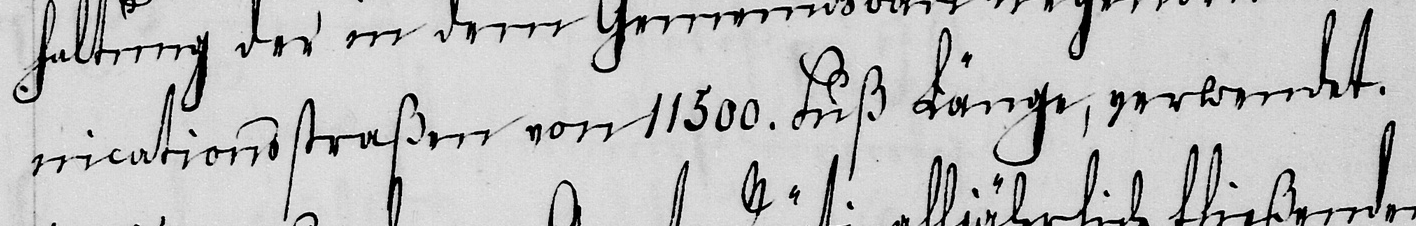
nicationsstraßen von 11500. Fuß Länge, verwendet.
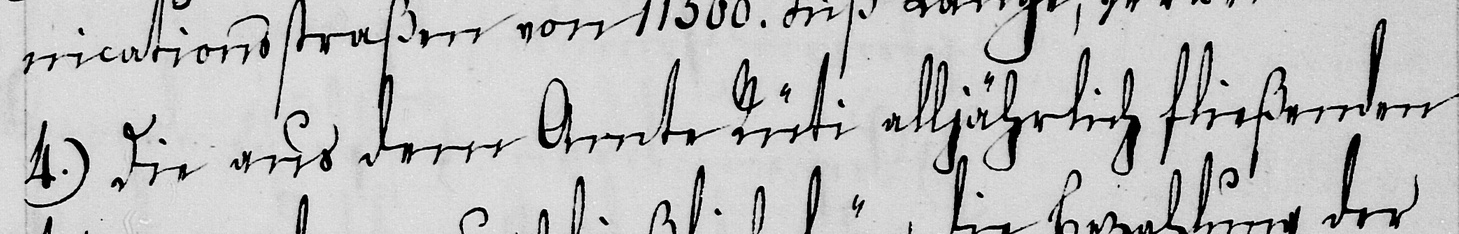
4.) Die aus dem Amte Rüti allfährlich fließenden
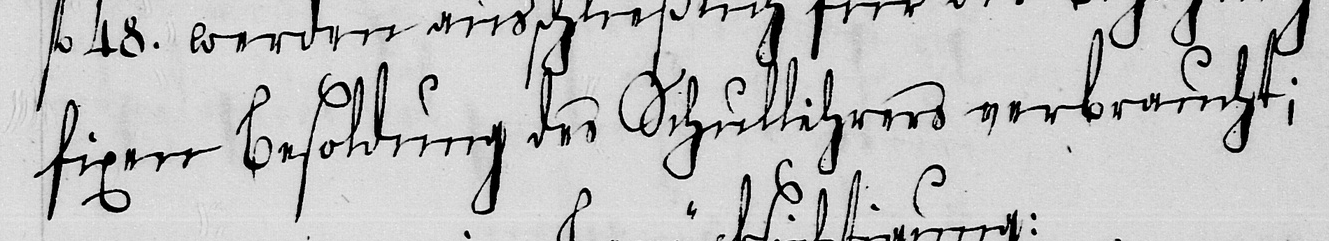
fixen Besoldung des Schullehrers verbraucht;
